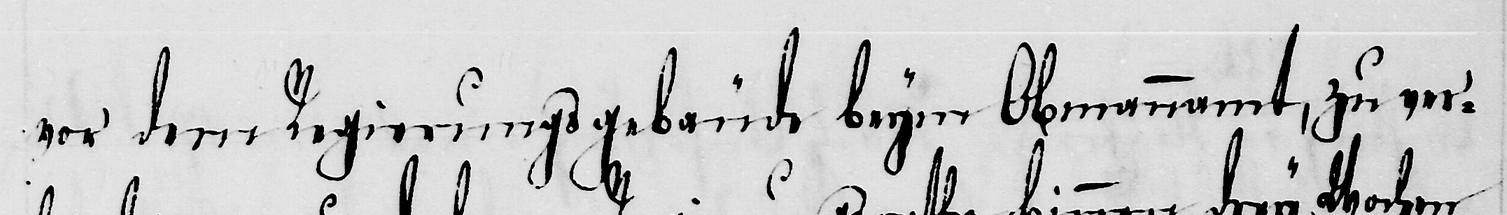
vor dem Regierungsgebäude beym Obmannamt, zu ver¬
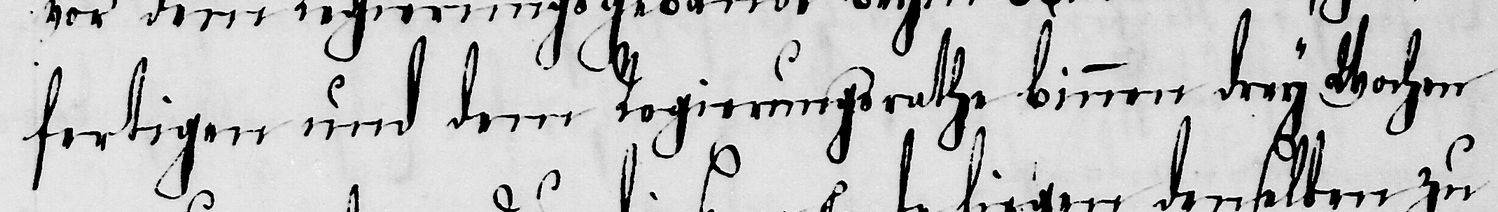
fertigen und dem Regierungsrathe binnen drey Wochen
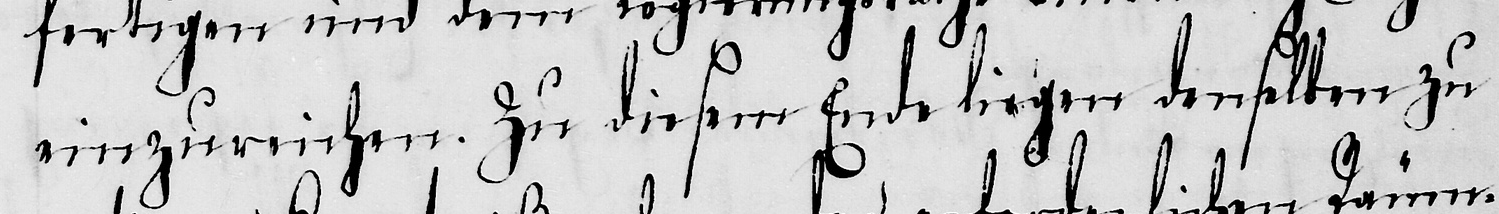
einzureichen. Zu diesem Ende liegen denselben zu
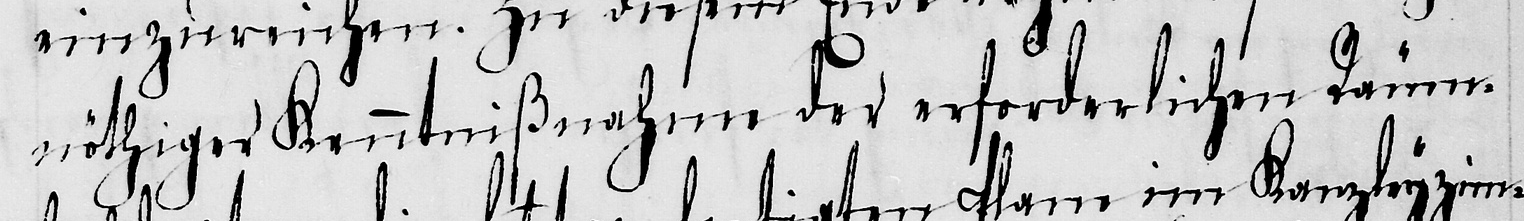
nöthiger Kenntnißnahme der erforderlichen Räum¬
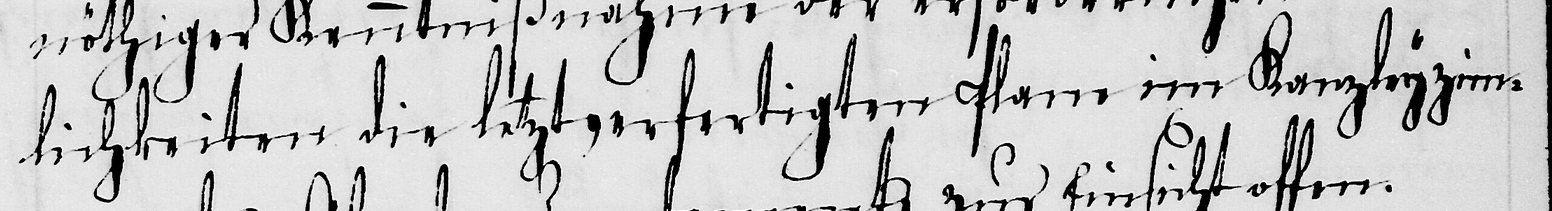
lichkeiten die letztverfertigten Plane im Kanzleyzim¬
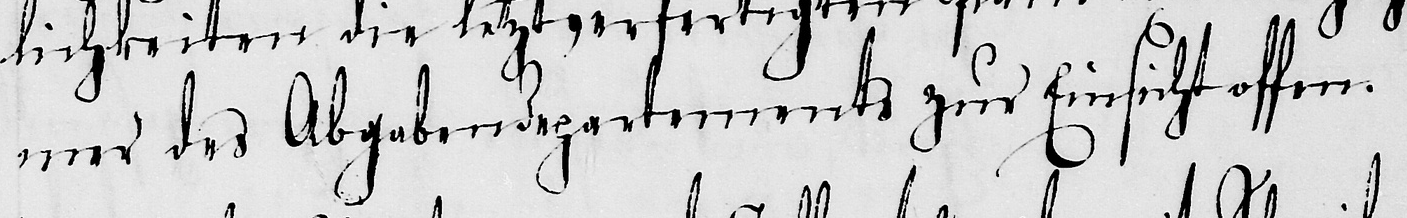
mer des Abgabendepartements zur Einsicht offen.
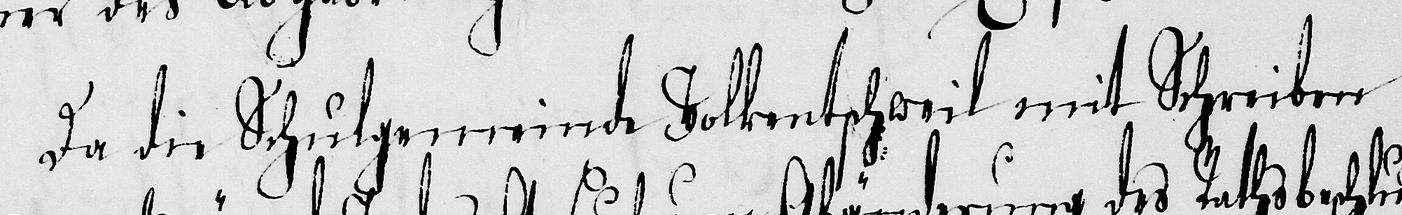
Da die Schulgemeinde Volkentschweil mit Schreiben
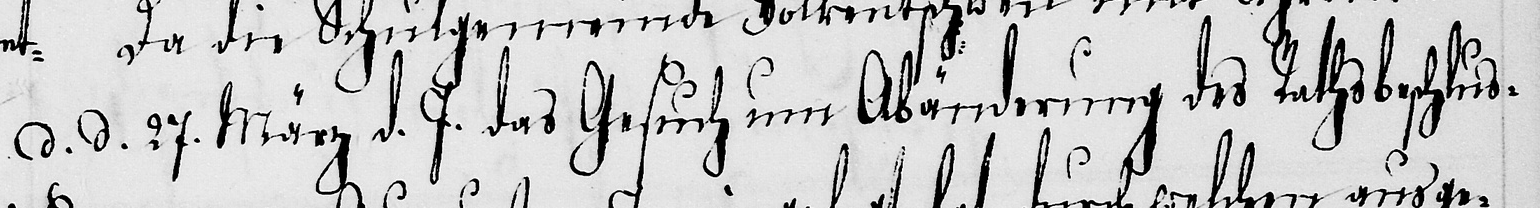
d. d. 27. März d. J. das Gesuch um Abänderung des Rathsbeschlu¬
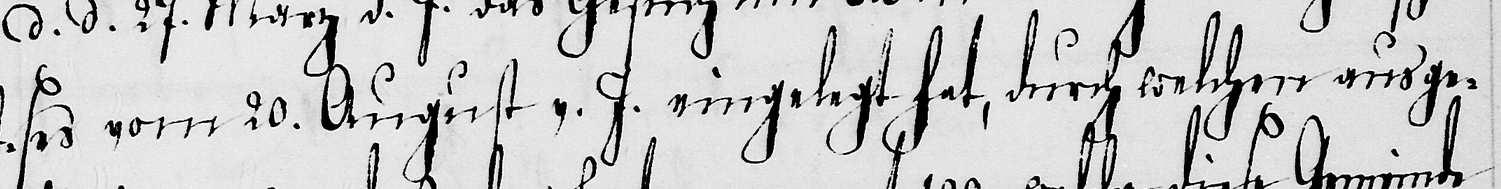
ßes vom 20. August v. J. eingelegt hat, durch welchen ausges¬
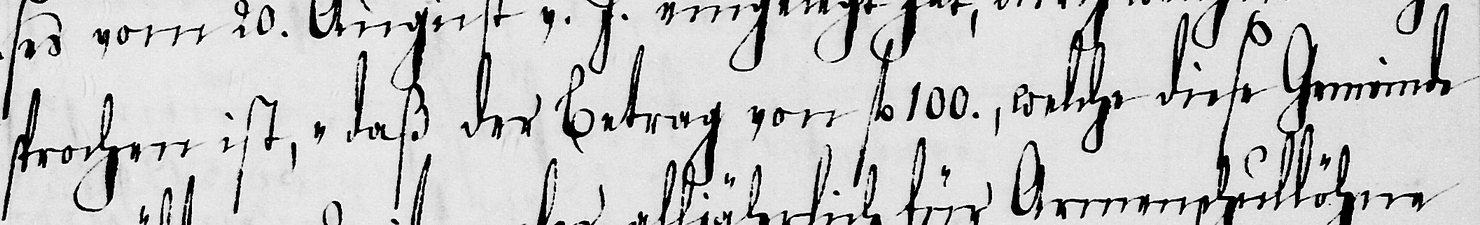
prochen ist, „daß der Betrag von fl. 100., welche diese Gemeinde
